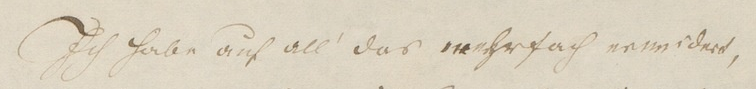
Ich habe auf all' das mehrfach erwidert,
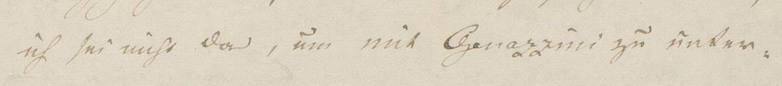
ich sei nicht da, um mit Genazzini zu unter-
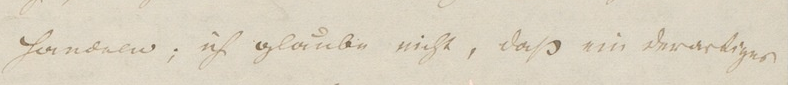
handeln; ich glaube nicht, daß ein derartiges
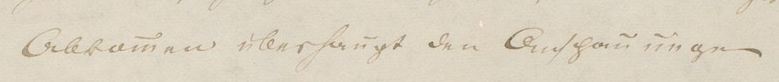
Abkommen überhaupt den Anschauungen
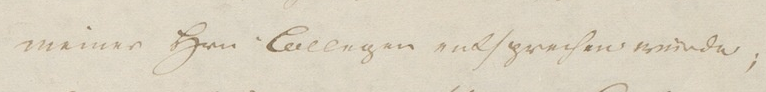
meiner Hrn. Collegen entsprechen würde;
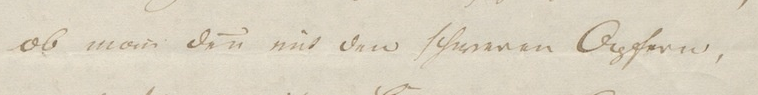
ob man denn mit den schweren Opfern,
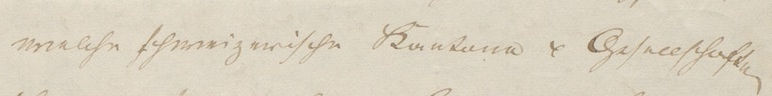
welche schweizerische Kantone & Gesellschaften
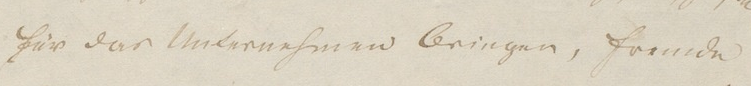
für das Unternehmen bringen, fremde
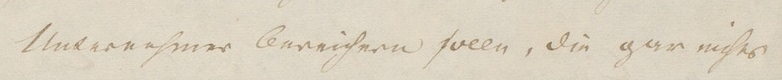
Unternehmer bereichern solle, die gar nichts
